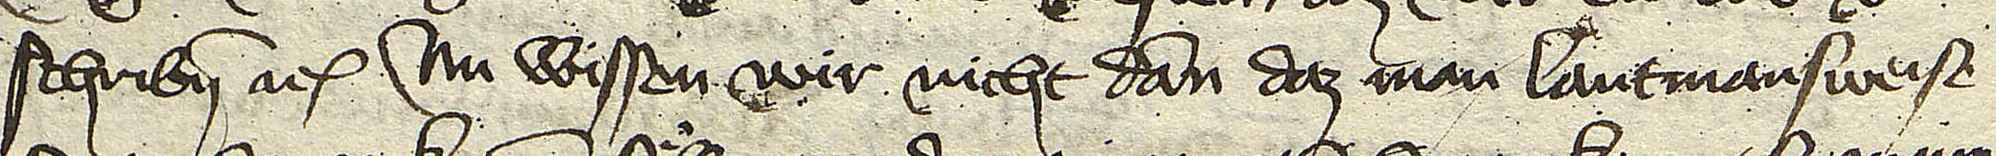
ſchribn* ec* Nu wiſſen wir nicht dan* daʒ man lantmanſweiſe
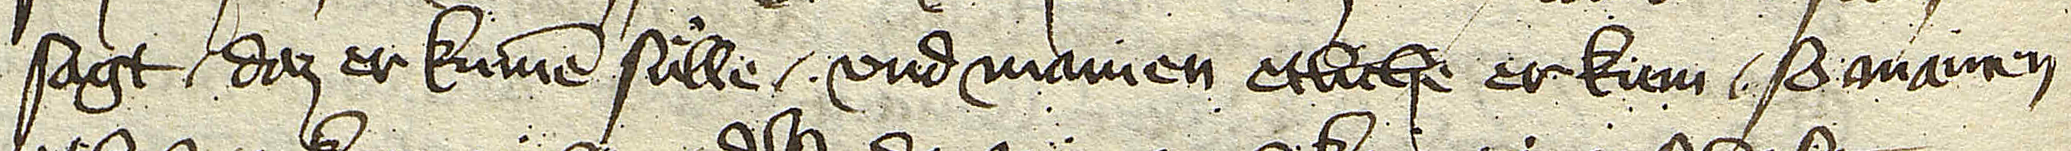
ſagt / daʒ er kume* ſülle / . vnd mainen etliche er kum / ſo mainen
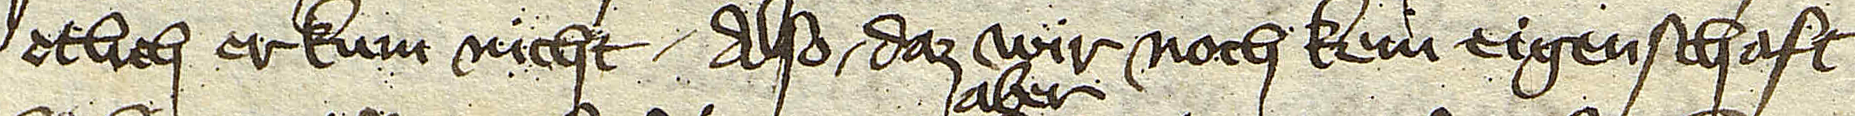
etlich er kum nicht / Alſo / daʒ wir noch kein eigenſchaft
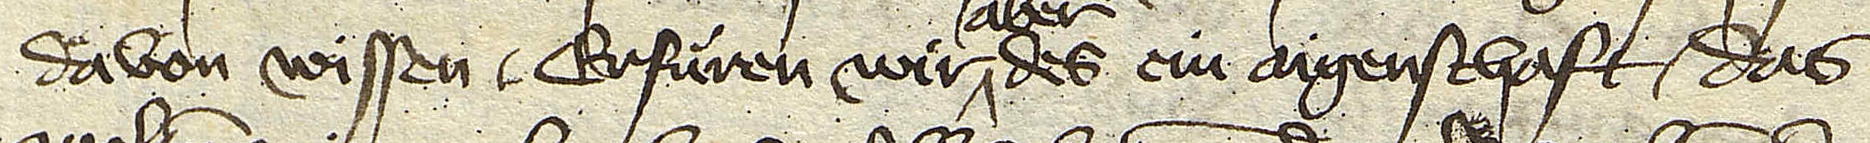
davon wiſſen / Erfüren wir des ein aigenſchaft / das
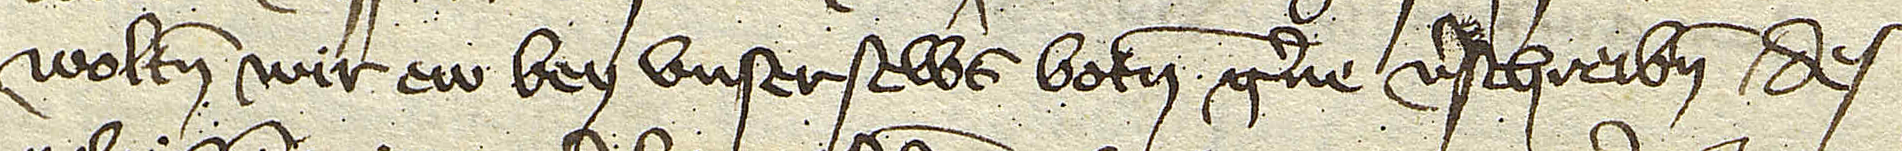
woltn* wir ew bey vnſer ſelbs botn* g*ne v*ſchreibn* / Deſ
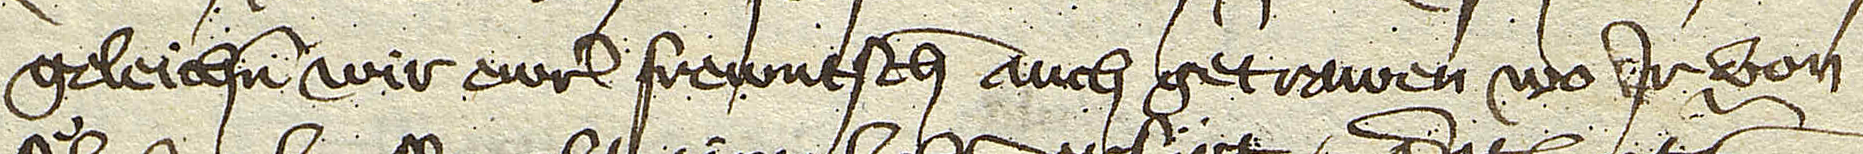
geleichn* wir ewr* frewntſch* auch getrawen wo Ir von
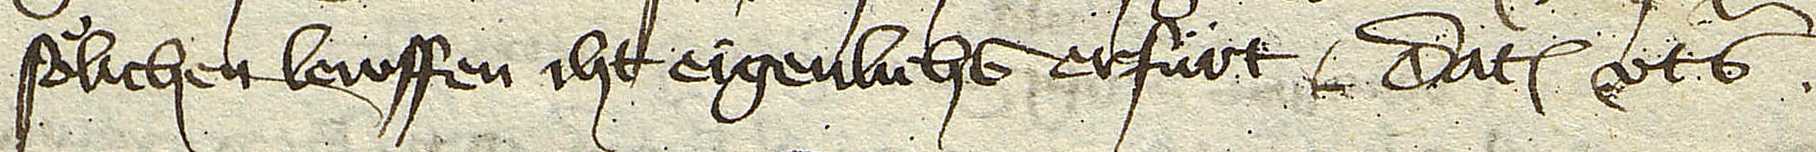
ſölichen lewſſen iht eigenlichs erfürt / Dat* vt s* .
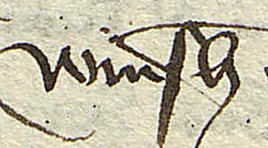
winſh*.
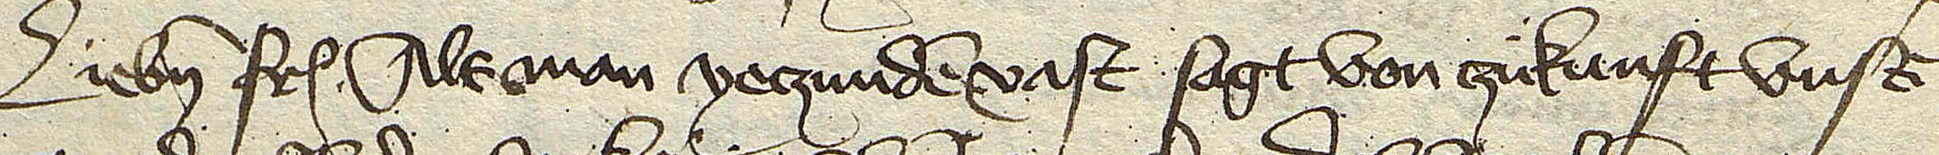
Liebn* fr* / Als man yecʒunde* vaſt ſagt von cʒükunft vnſs*
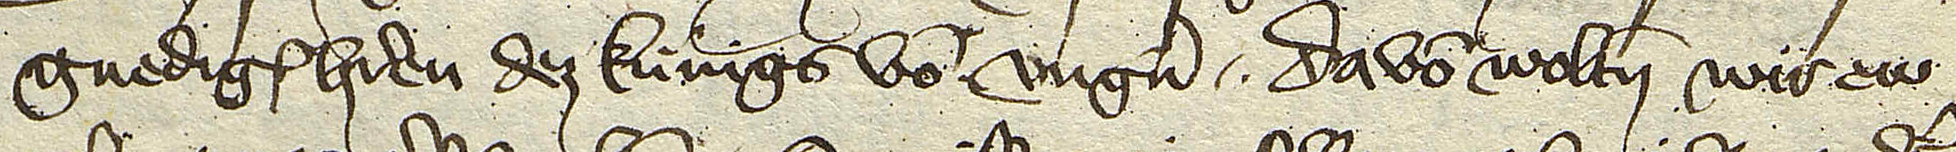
gnedig* hr*en deʒ künigs vo* vngn* / . Davo* woltn* wir ew
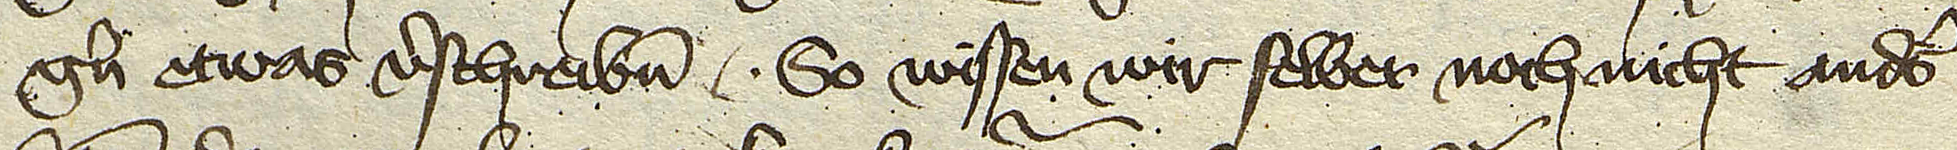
g*n etwas v*ſchreibn* / . So wiſſen wir ſelber noch nicht ands*
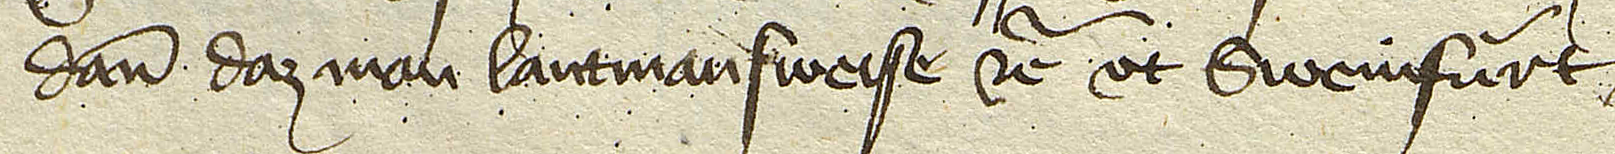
dan* daʒ man lantmanſweiſe ec* vt Sweinfürt /
